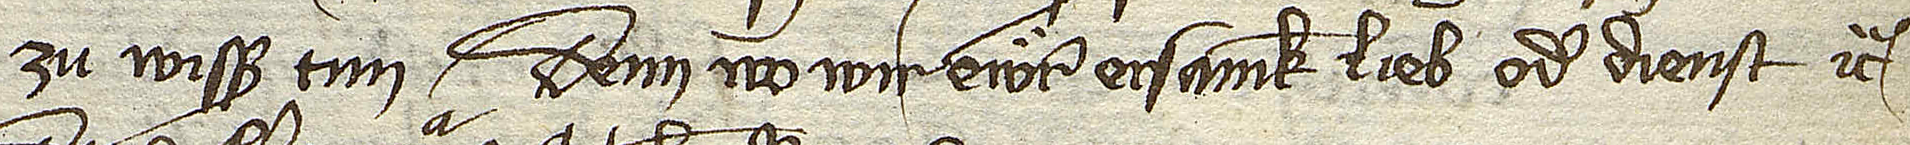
ʒu wiſſ* tun / Denn wo wir ewr erſamk* lieb od* dienſt ec*
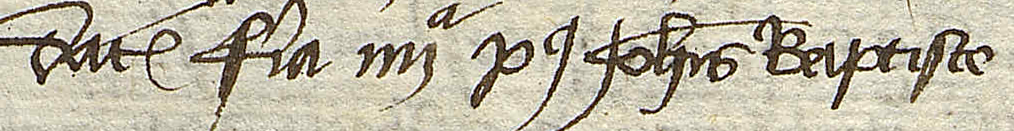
Dat* fia* iiii* p* Iohis* Baptiſte
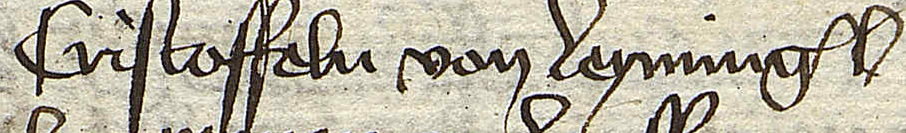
Criſtoffeln von Leyming* h
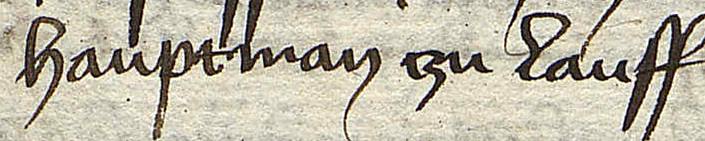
hauptman cʒu lauff
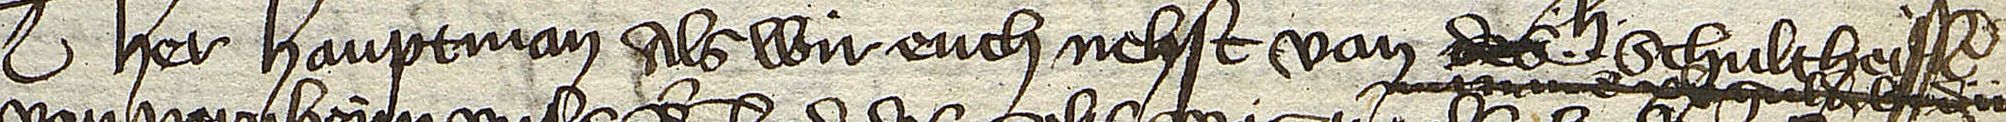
L* her hauptman Als wir euch nehſt von des ~ Schultheiſſe*
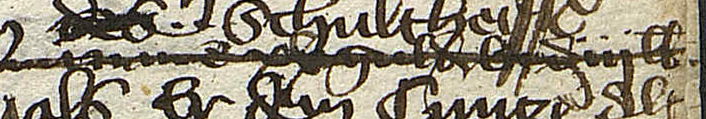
mitname* xv guld* vnd iii lb*
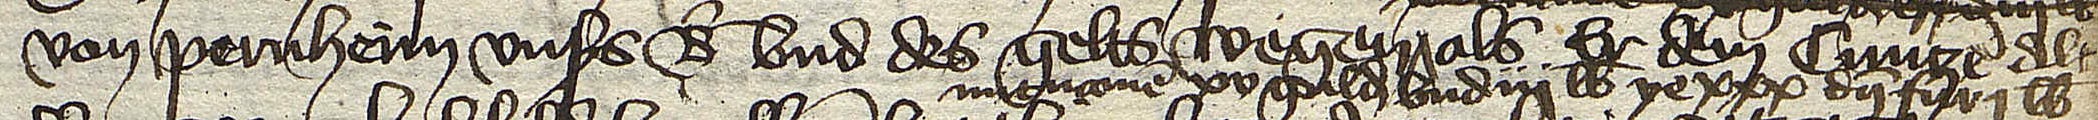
von pernheim vnſ*s B* vnd des gelts wegen als Er dem Cuncʒe Al
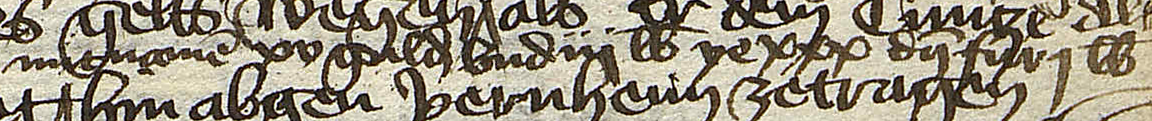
mitname* xv guld* vnd iii lb* ye xxx dn* für i lb*
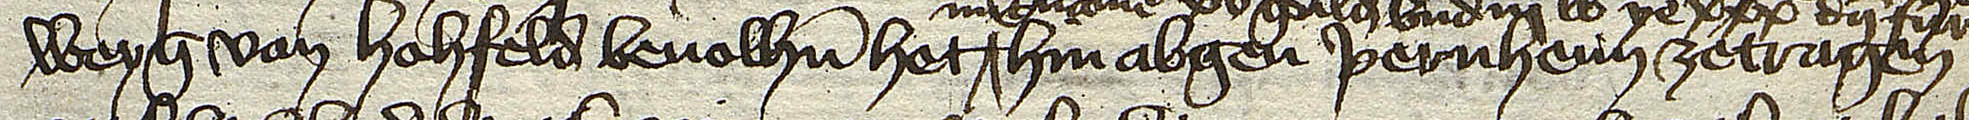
weyg von hohfeld beuolh*n het hin abgen pernheim cʒetragen
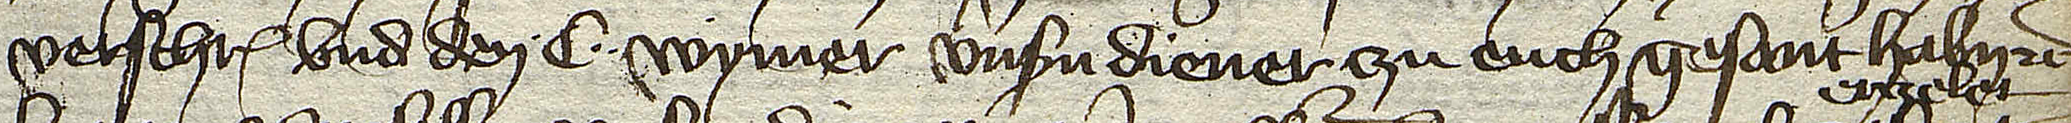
verſchr* vnd den . C . wymer vnſ*n diener cʒu euch geſant hab*n ec*
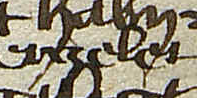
ercʒelet
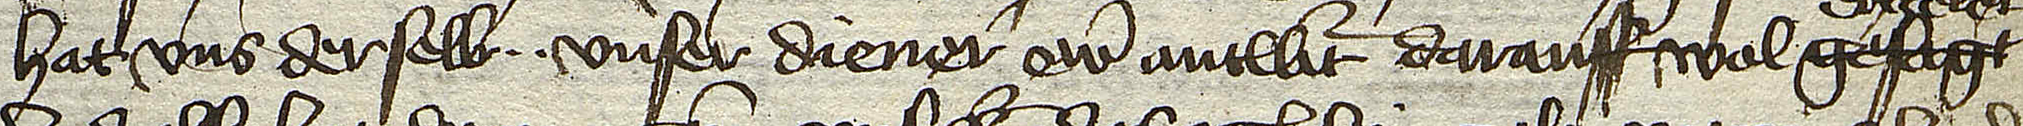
hat vns derſelb ~ vnſer diener ew* antw*t darauff wol geſagt
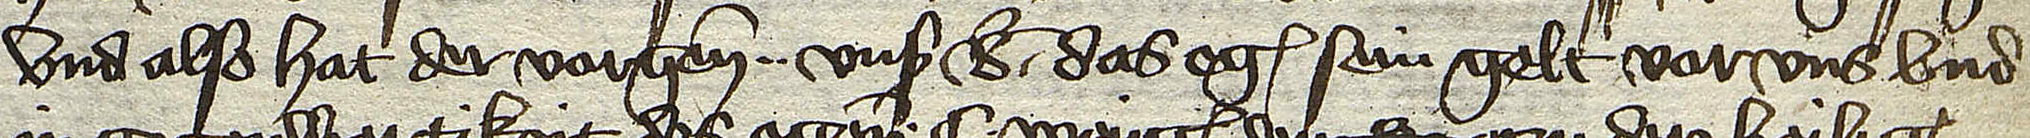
vnd alſo hat der vorgen* ~ vnſ* B* . das eg* ſein gelt vor vns vnd
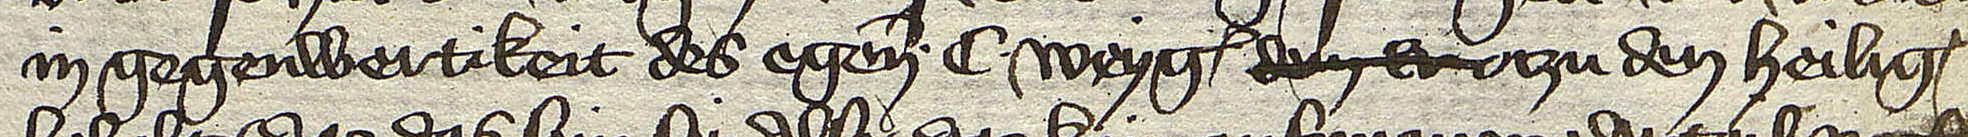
in gegenwertikeit des egen* . C . weyg* dem er cʒu den heilig*
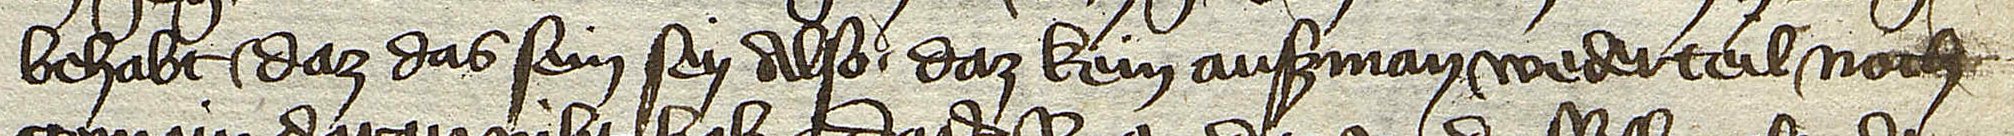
behabt / daʒ das ſein ſey Alſo / daʒ kein auſʒman weder teil noch
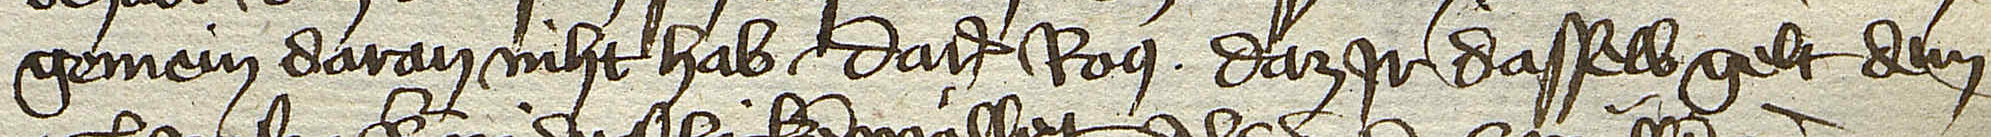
gemein daran niht hab / Dar* Ro* . daʒ Ir daſſelb gelt dem
